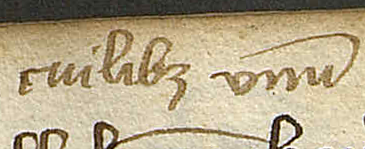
cuilib* vnu*
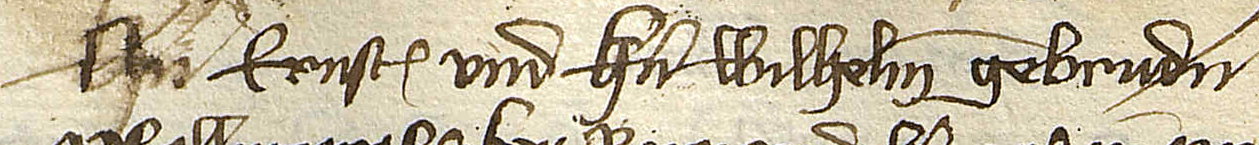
Hn* Ernſt* vnd Hn* Wilhelm* gebrudn*
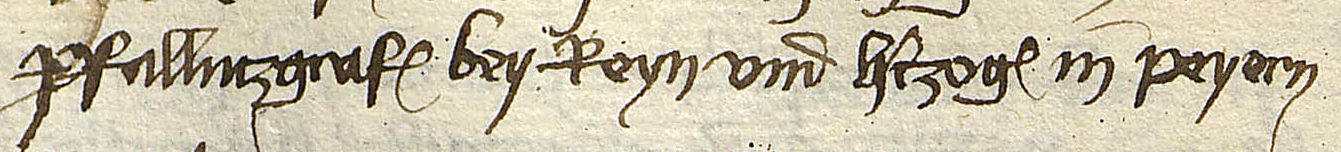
Pfallncʒgraf* bey Reyn vnd h*cʒog in peyern
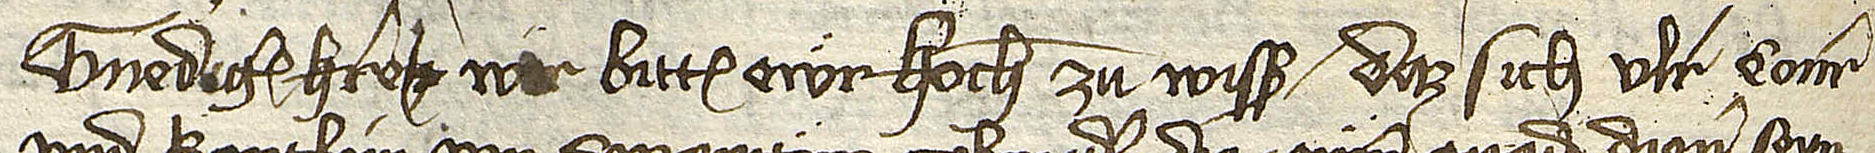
Gnedig* hr*e wir bitt* eẅr hoch* cʒu wiſſ* / daʒ ſich vlr* Conr*
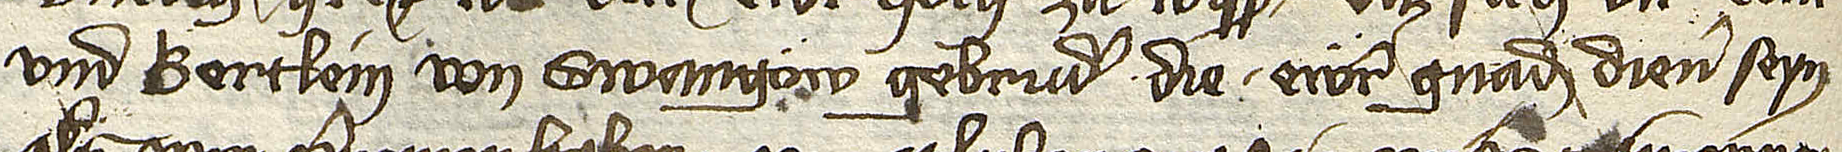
vnd Bertlein von Swangoẅ gebrud* die / eẅr* gnad* dien* ſeyn
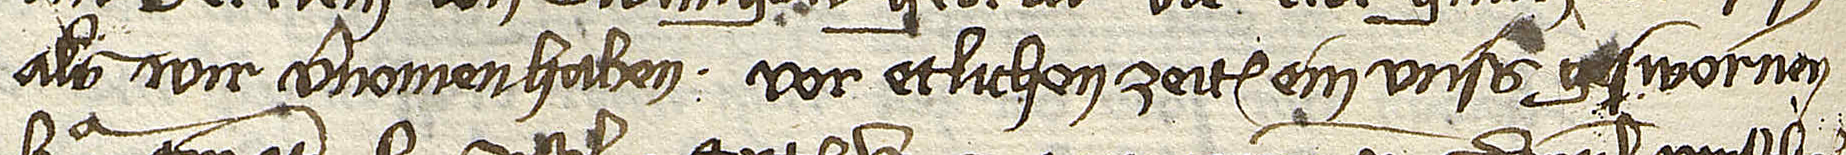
als wir v*nomen haben vor etlichen cʒeit* ein vnſ*s geſwornen
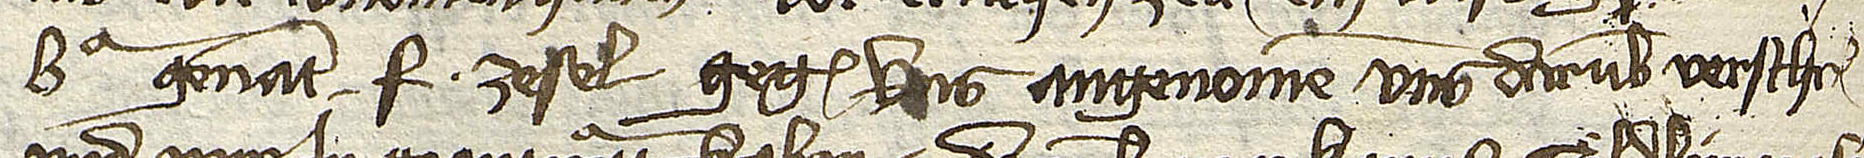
b* genat* f . ʒeſel geg* vns angenome* vns darub* verſchr*
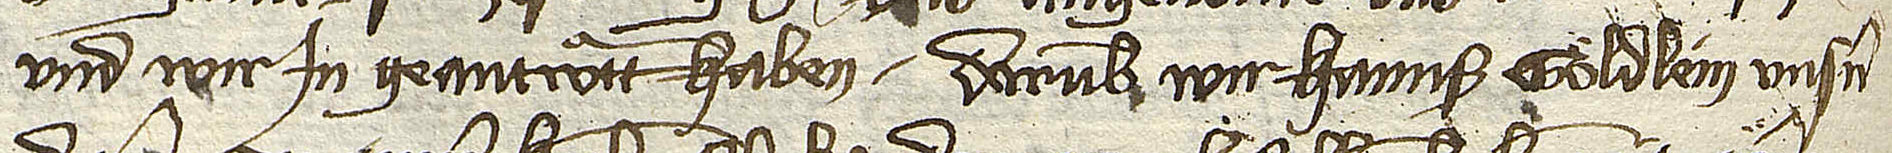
vnd wir In geantwtt* haben / Darub* wie hannſ* Göldlein vnſn*
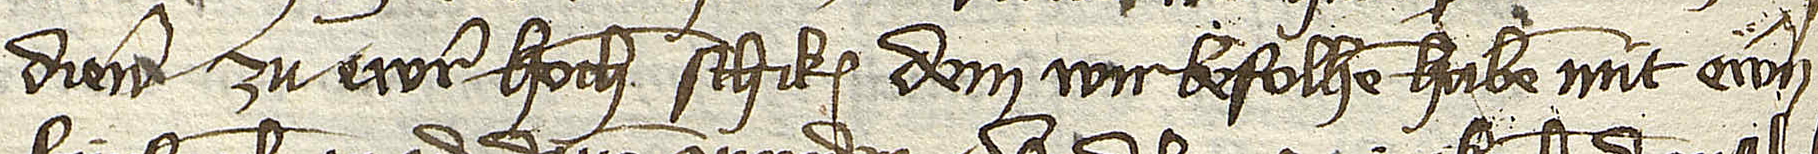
dien* ʒu ewr* hoch* ſchik* dem wir befolhe* habe* mit eẅn*
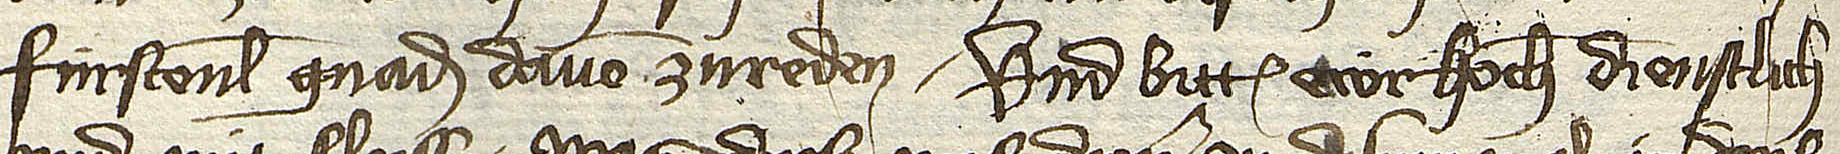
fürſtenl* gnad* dauo* ʒureden / Vnd bitt* eẅr hoch* dienſtlich
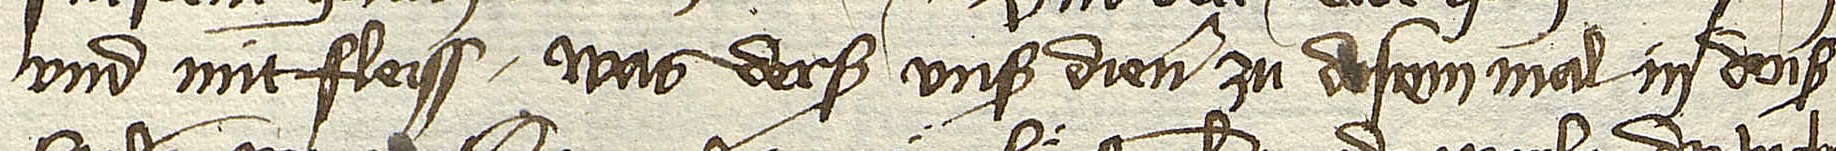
vnd mit fleiſſ / was derſ* vnſ* dien* ʒu diſem mal in denſ*
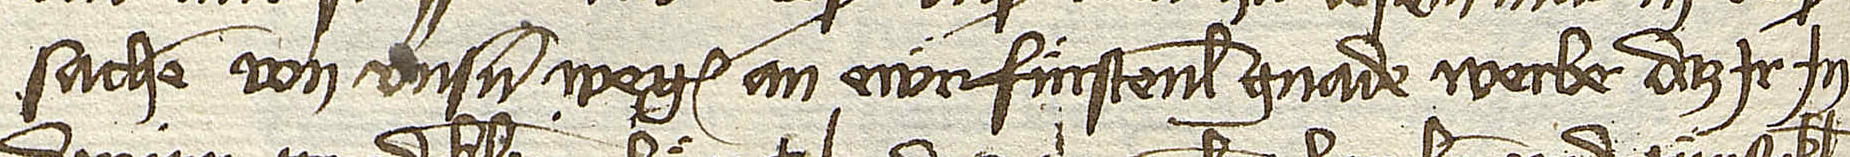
ſache* von vnſn* weg* an eẅr fürſtenl* gnade werbe daʒ Ir In
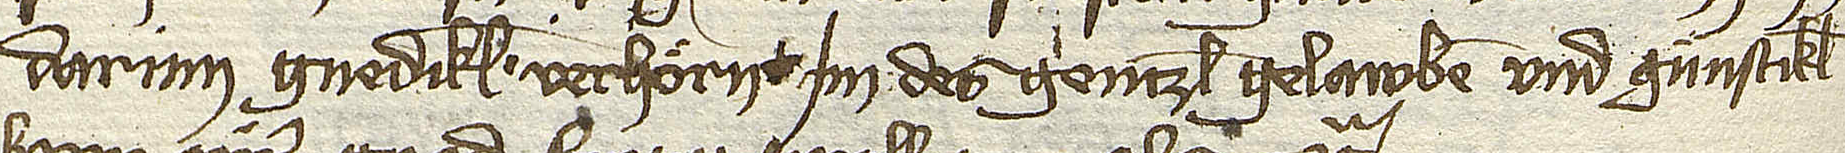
darinn gnedikl* verhörn Im des gencʒl* gelawbe* vnd günſtikl*
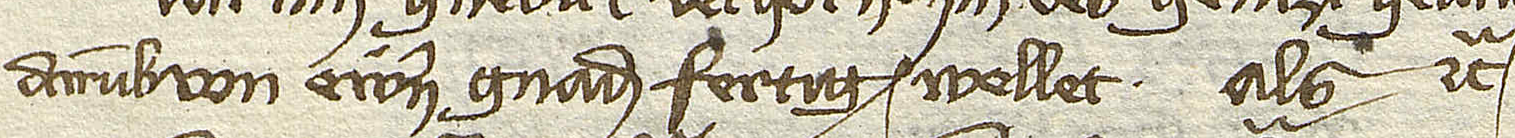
darub* von eẅ*n gnad* fertig* wellet . als ec*
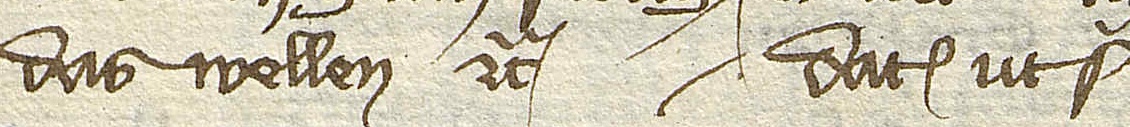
das wellen ec* / Dat* ut ſ*
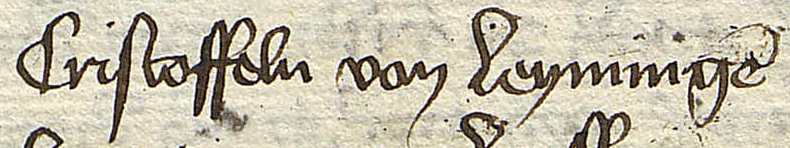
Criſtoffeln von leyminge*
